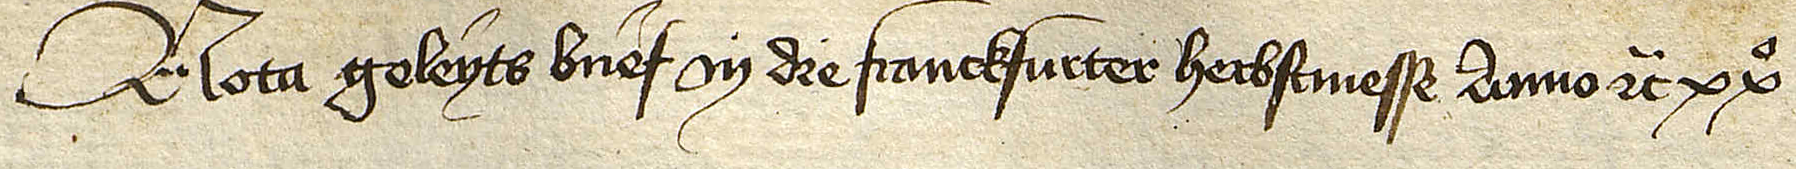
Nota geleyts brief in die franckfurter herbſtmeſſe Anno ec* xx*
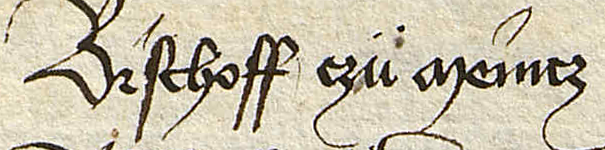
Biſchoff cʒü Meincʒ
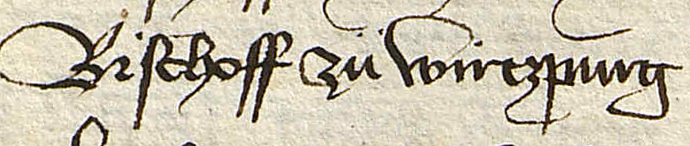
Biſchoff cʒü wircʒpurg
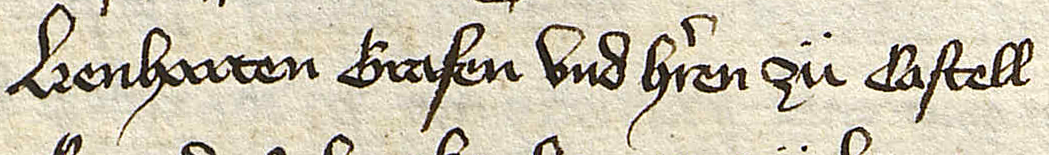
Lienharten Grafen vnd h*ren cʒü Caſtell
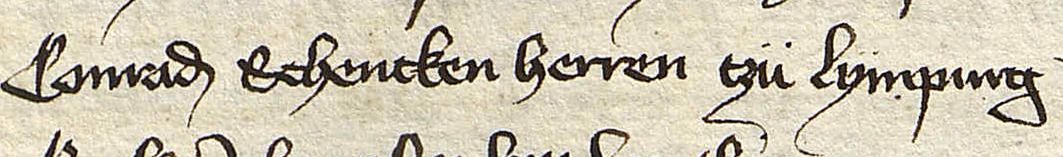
Conrad* Schencken herren cʒü Lympurg
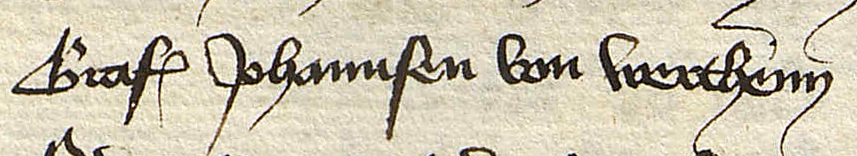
Graf* Iohannſen von wertheim
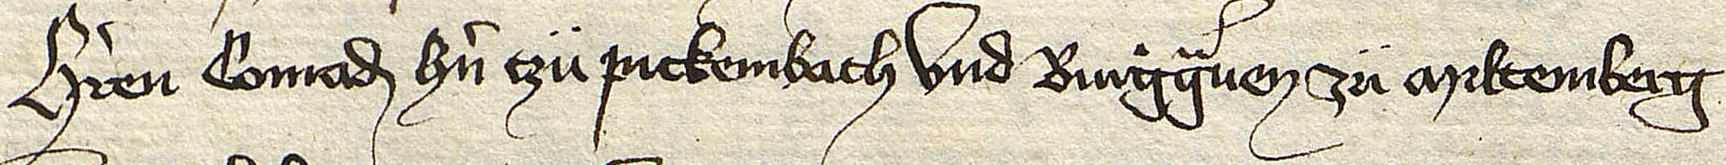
H*ren Conrad* hn* cʒü pickembach vnd Burgg*uen cʒü Miltemberg
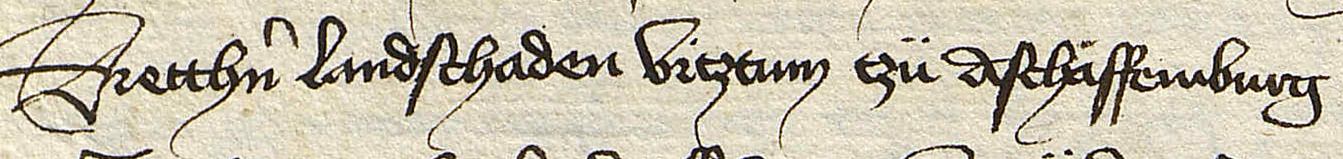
Dietthn* landſchaden vicʒtum cʒü Aſchaffemburg
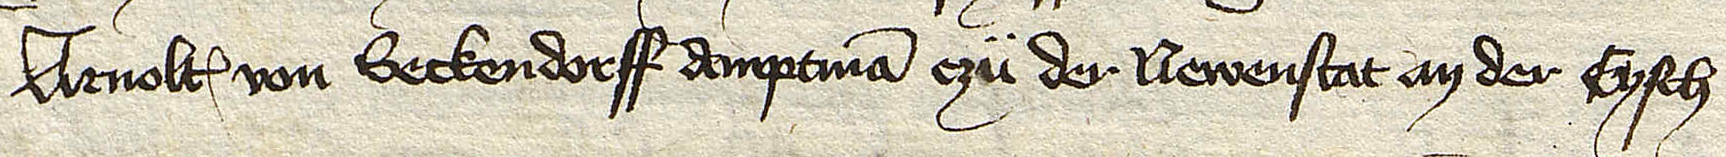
Arnolt* von Seckendorff Amptma* cʒü der Newenſtat an der Eyſch
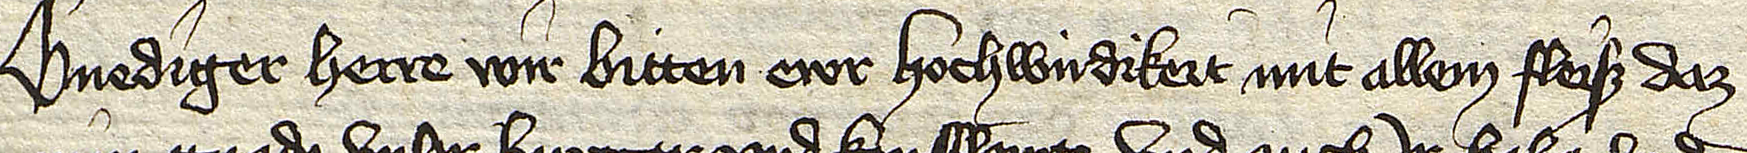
Gnediger herre wir bitten ewr hochwirdikeit mit allem fleiſʒ daʒ
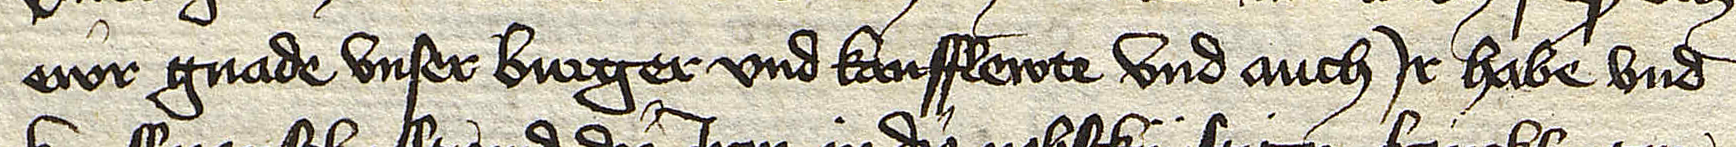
eẅr gnade vnſer burger vnd kaufflewte vnd auch ir habe vnd
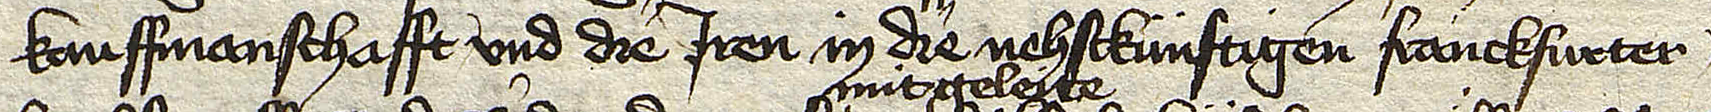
kauffmanſchafft vnd de Iren in die nehſtkünftigen franckfurter
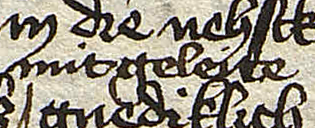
mit geleite
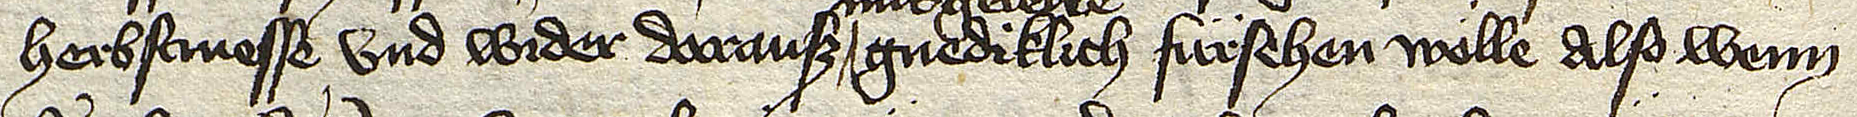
herbſtmeſſe vnd wider darauſʒ gnediklich fürſehen wölle Alſo wenn
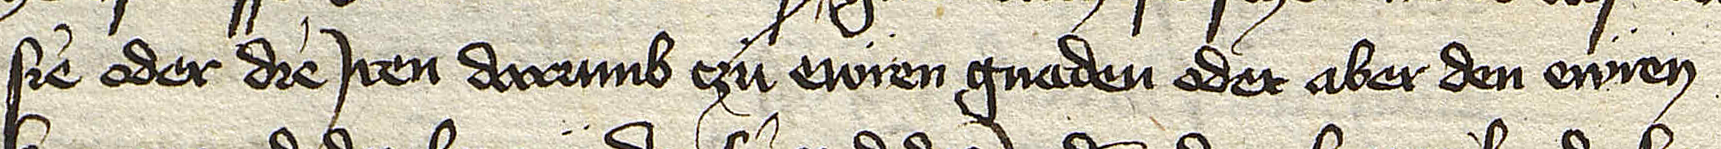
ſie oder die Iren darumb cʒü eẅren gnaden oder aber den eẅren
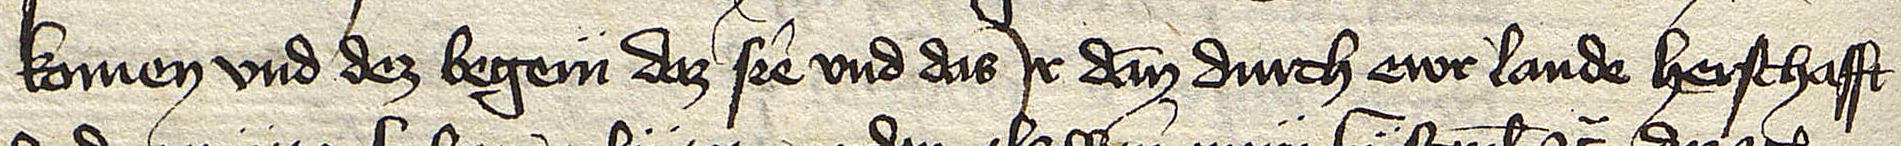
komen vnd deʒ begern daʒ ſie vnd das Ir dan* durch ewr lande herſchafft
